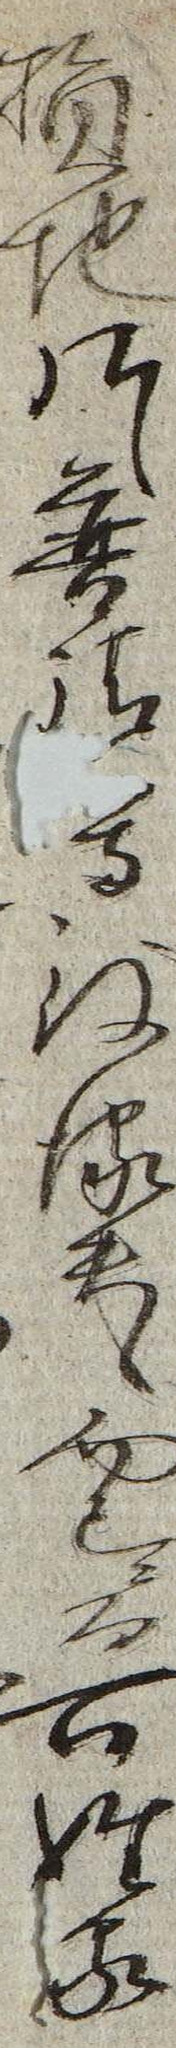損地御普請致流失候のみにて百姓家
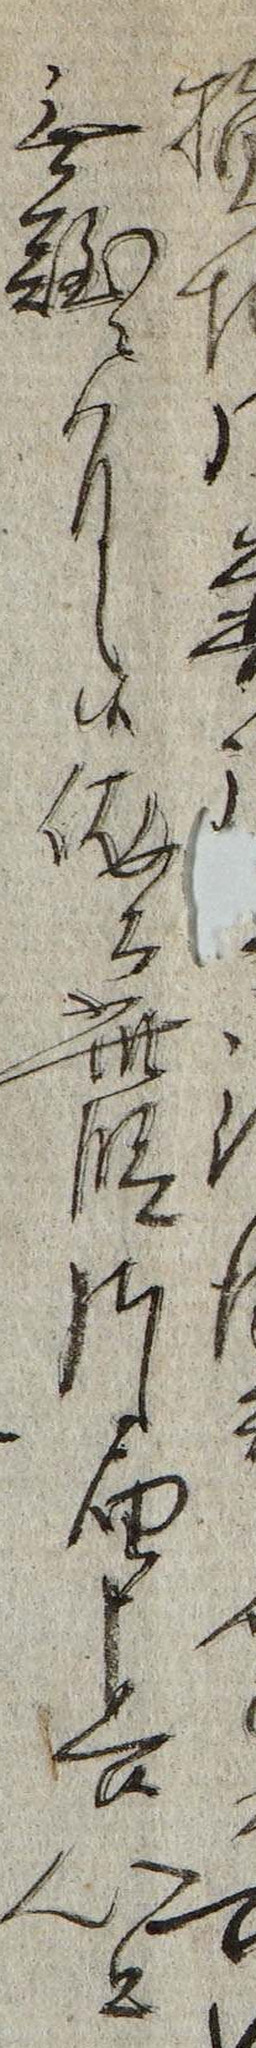無難に有之候依て此段御届申上候以上
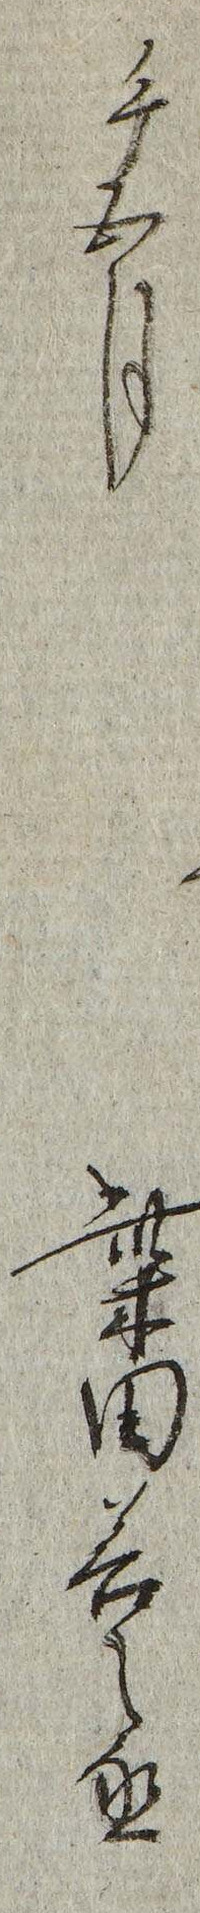午五月柴田善之丞

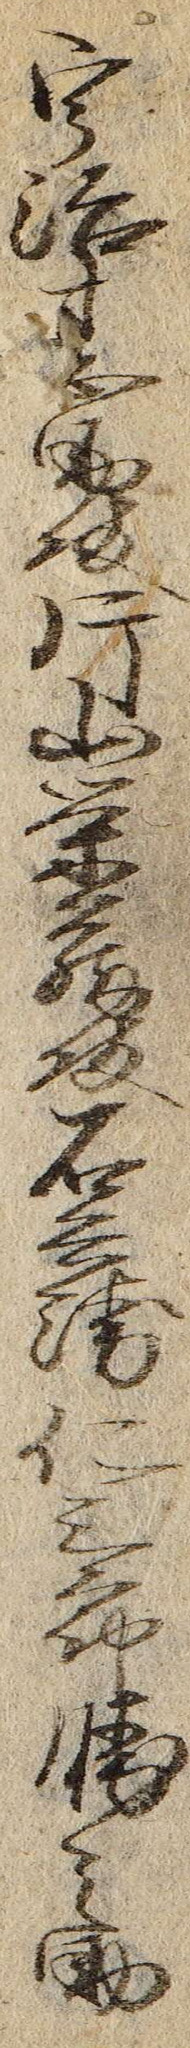宇治甚助殿片山栄蔵殿石兵衛仁三郎勝之助
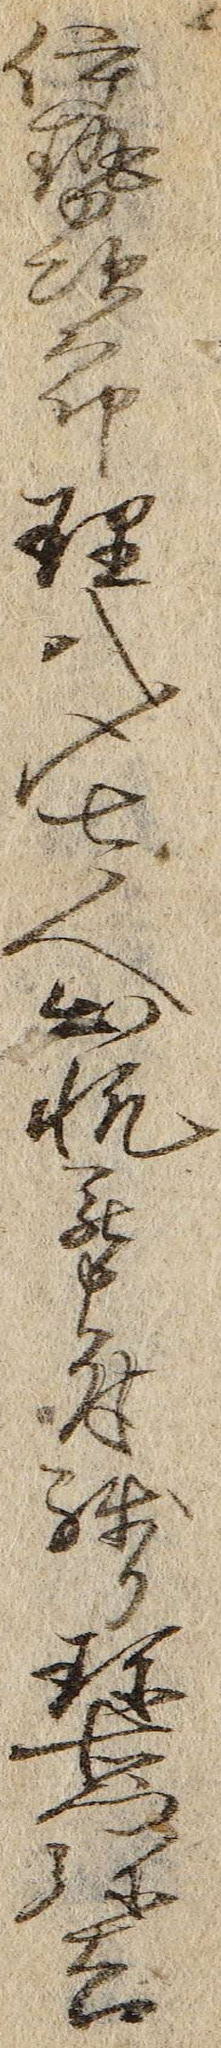伊勢次郎理八しめて七人出帆被申付残り弥右衛門弥吉
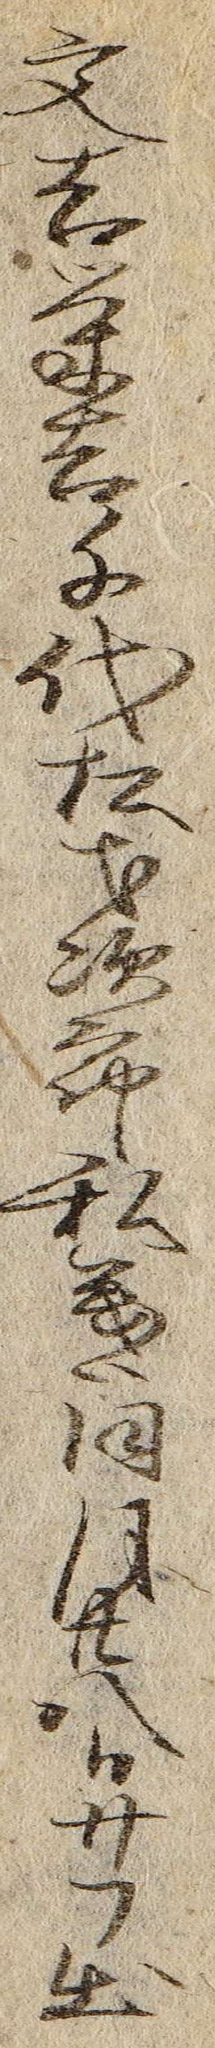文吉栄吉千代松才次郎私義は同月二十八日サフ出
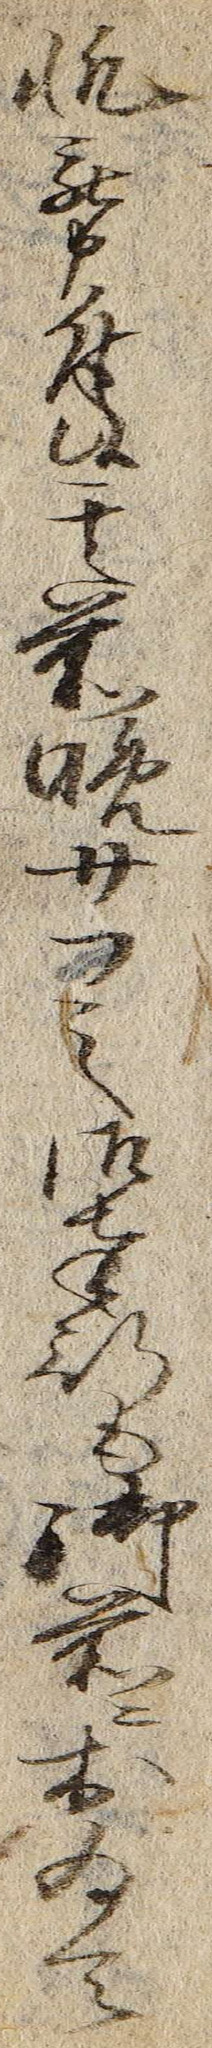帆被申付候其前晩サフの御奉行も御前におゐて
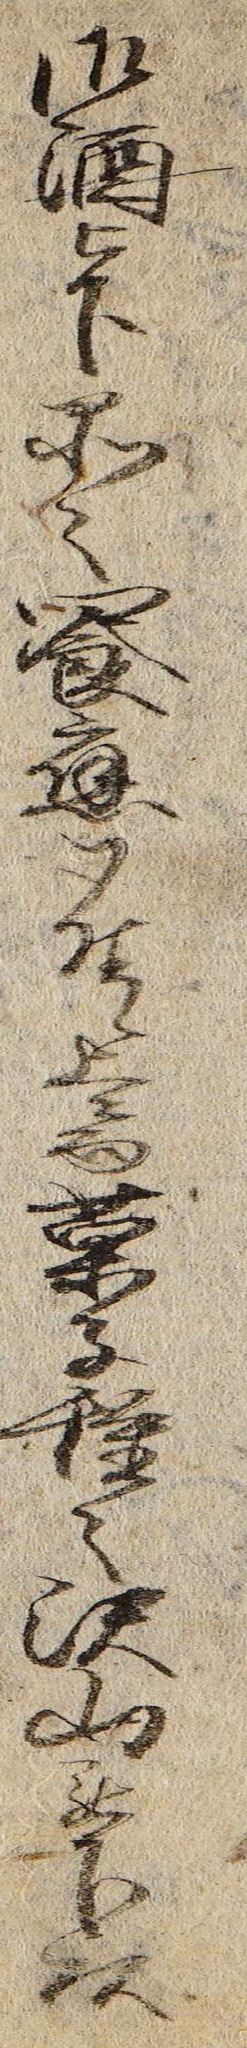酒被下品々饗応御座候上にて菓子種々沢山被下頭
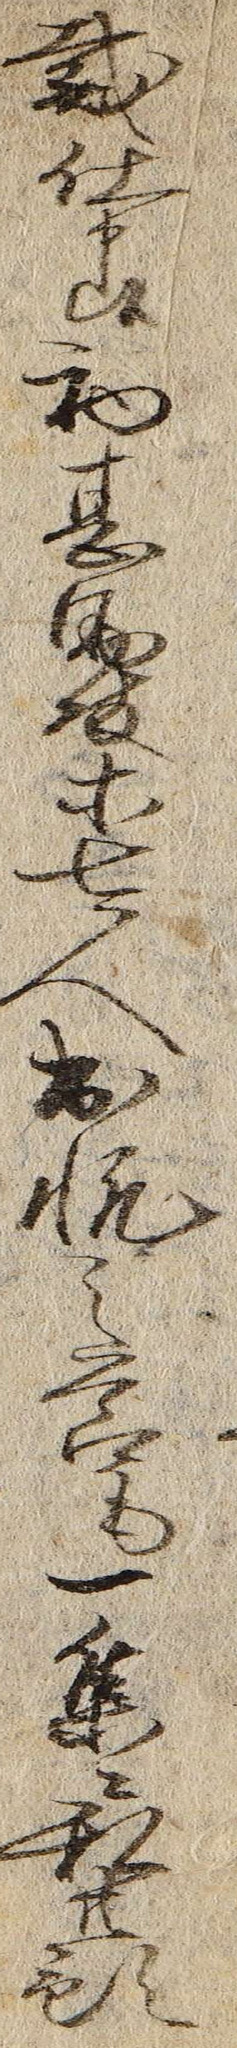戴仕申候初甚助殿等七人出帆の節も一集に私ども預
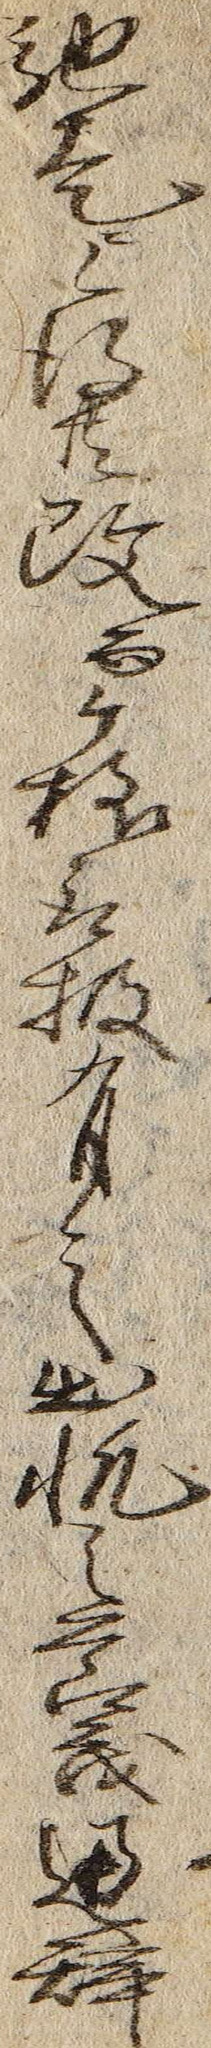馳走に候得ども改てケ様取扱有之出帆の節も通辞
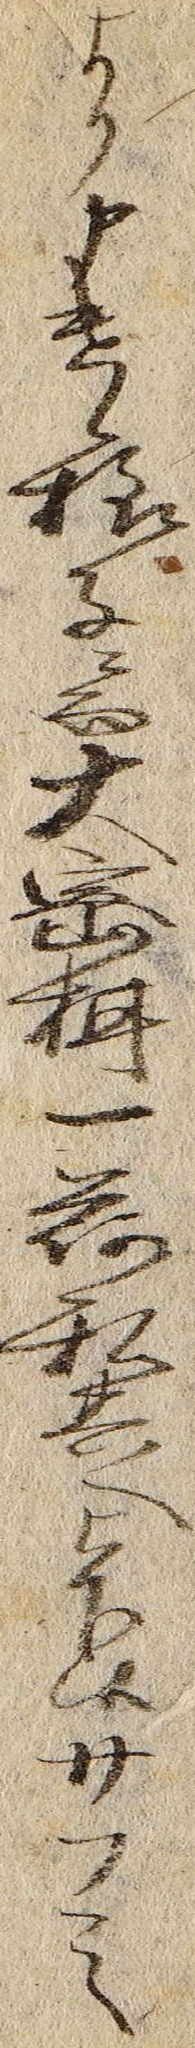より申遣候様子にて大蜜柑一荷私どもへ被下候サフの
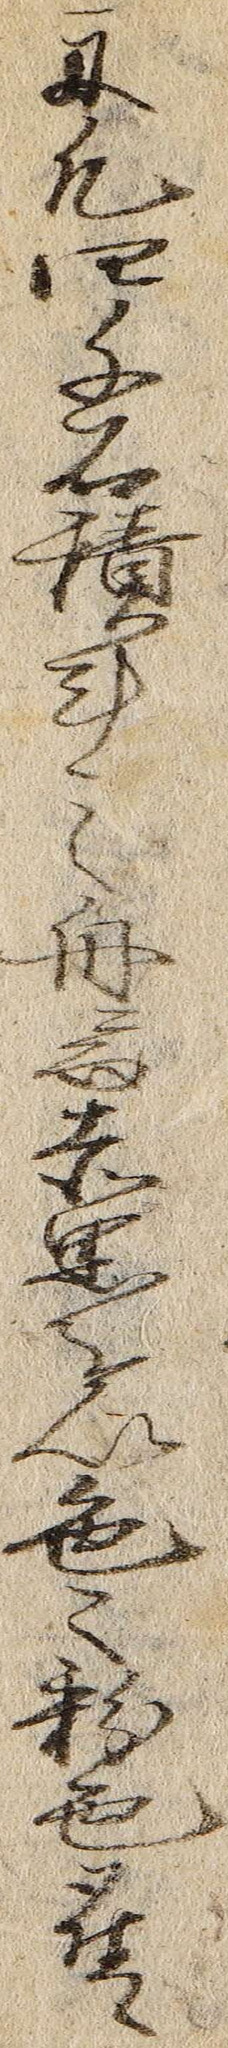舟凡四千石積斗の舟にて赤黒を以色々彩色御座候
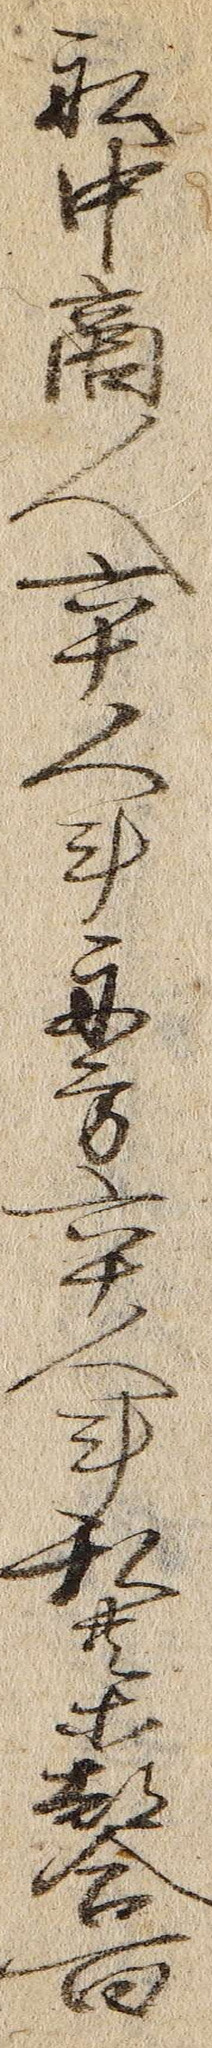船中商人六十人斗舟方六十人斗私ども等都合百
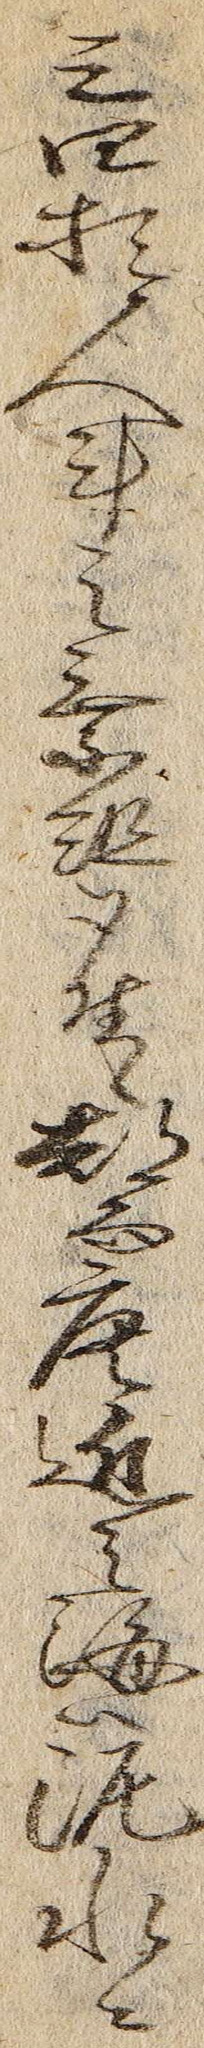三四十人斗の乗組御座候都て唐近の海は泥水に
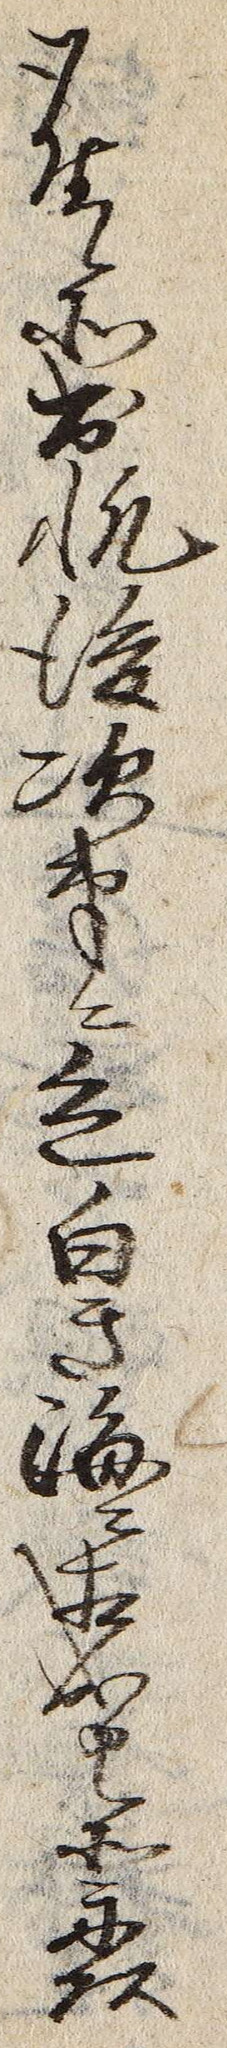御座候所出帆後次第に色白き海に相成申候所舟頭
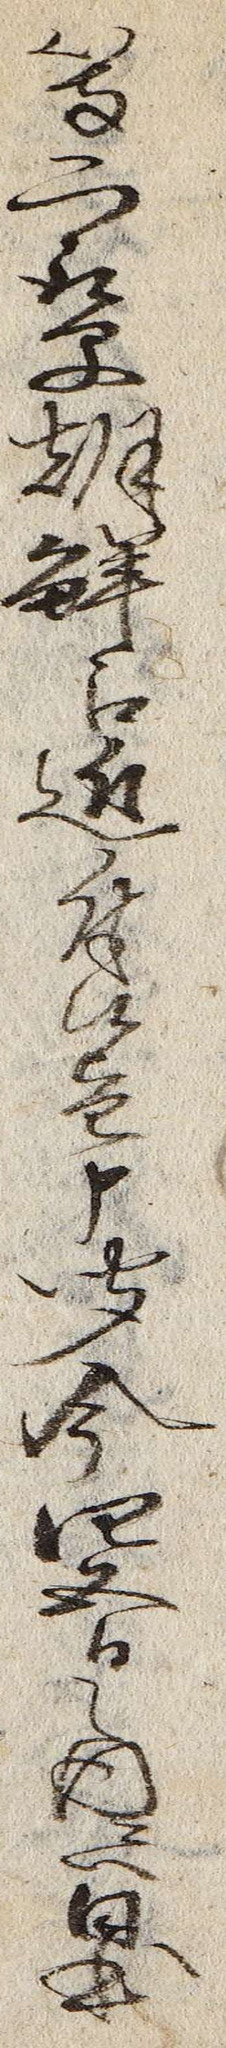等最早朝鮮へ近付候旨申聞今四五日の内には日本
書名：能登国清兵衛異国江漂流之始末
